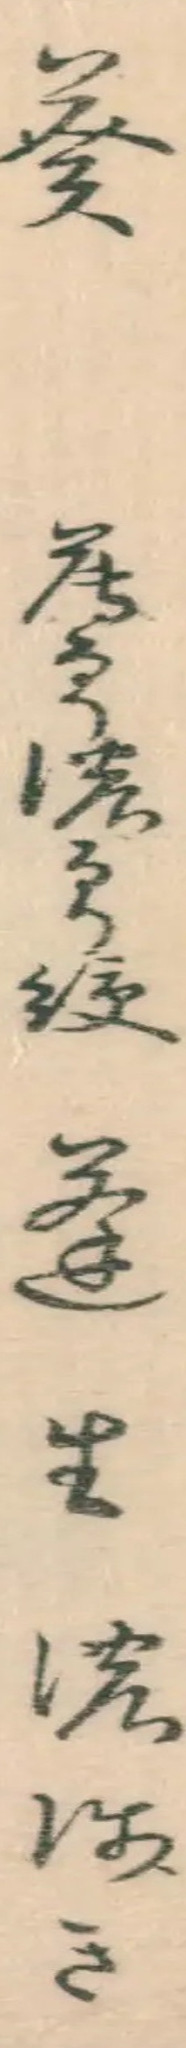葵薄るり濃るり絞蓬生濃浅き
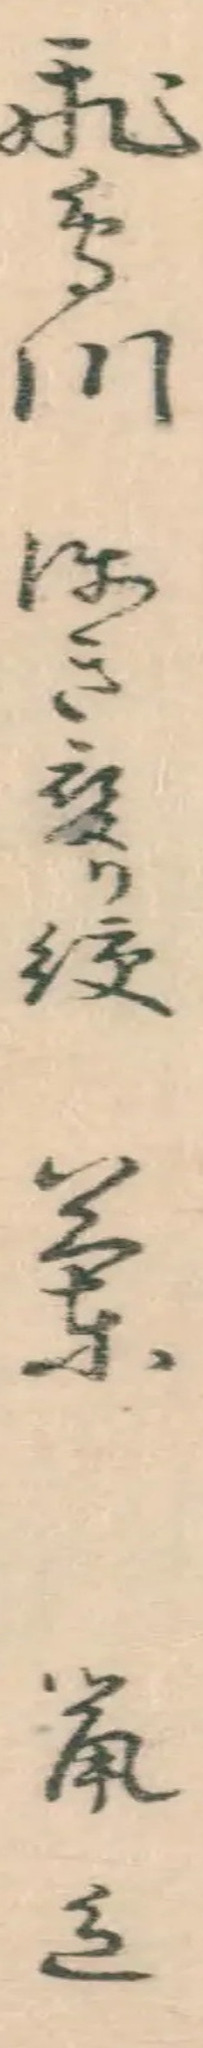飛鳥川浅き変り絞葉鼡色
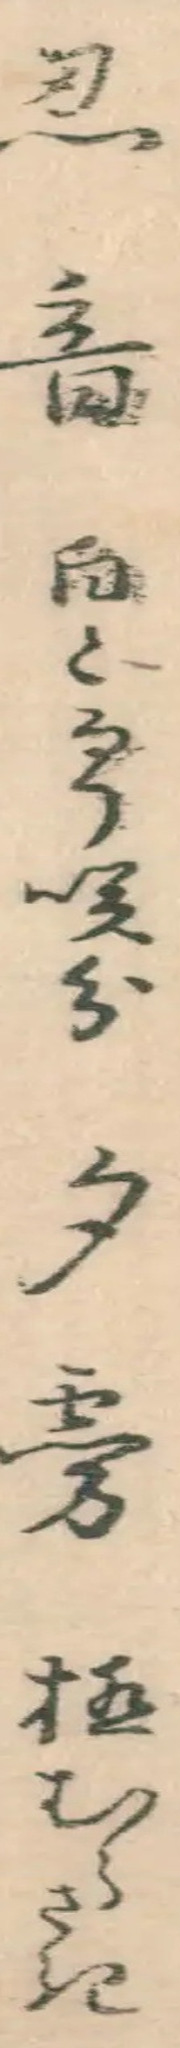忍音白とるり咲分夕霧極むらさき
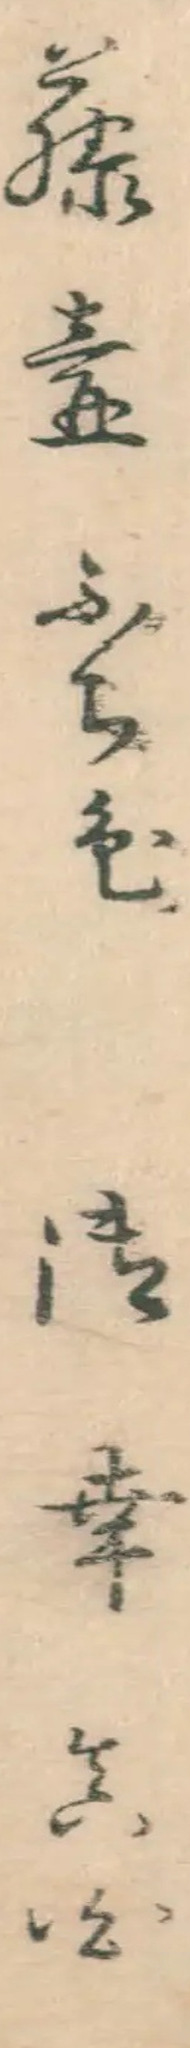藤壷ふち色御幸真花

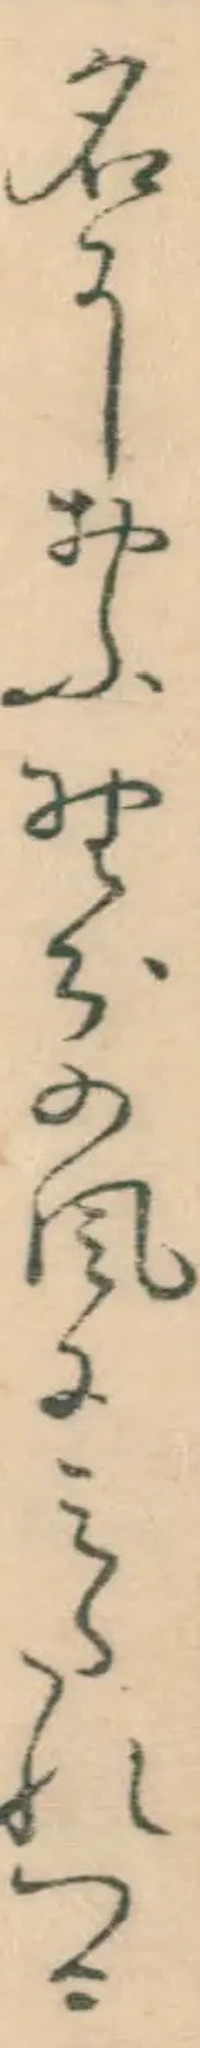名にしおふ野分の風にみたれつる
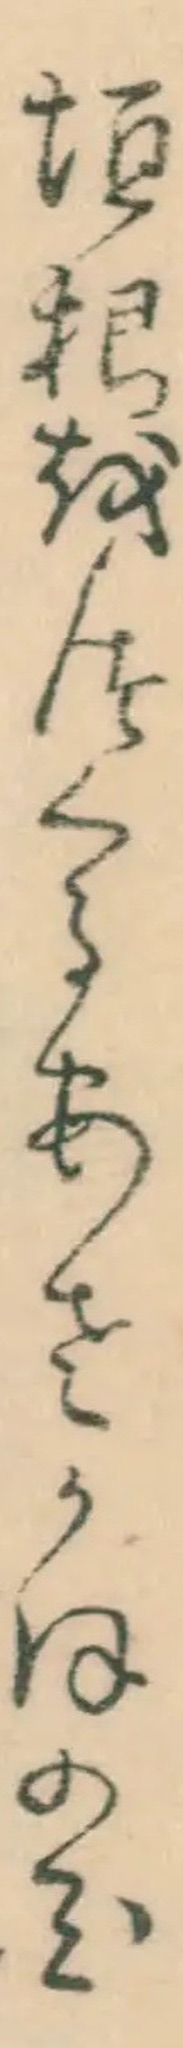垣根をつくるあさかほの花蟹丸
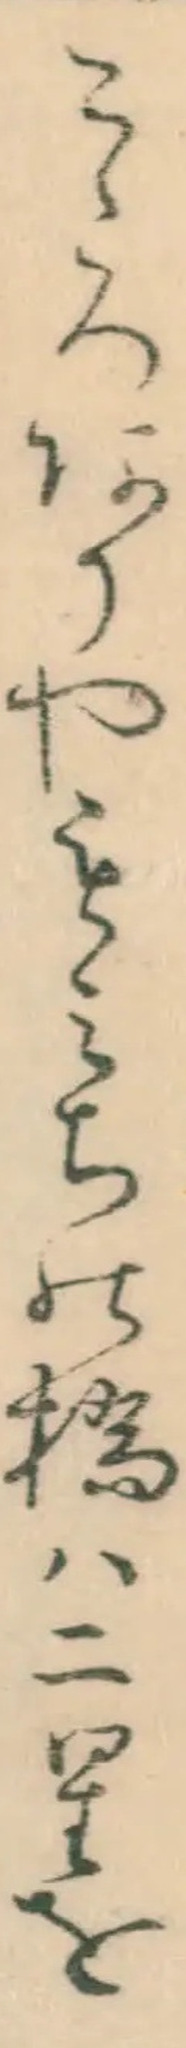こゝろありやもみちの橋は二星を
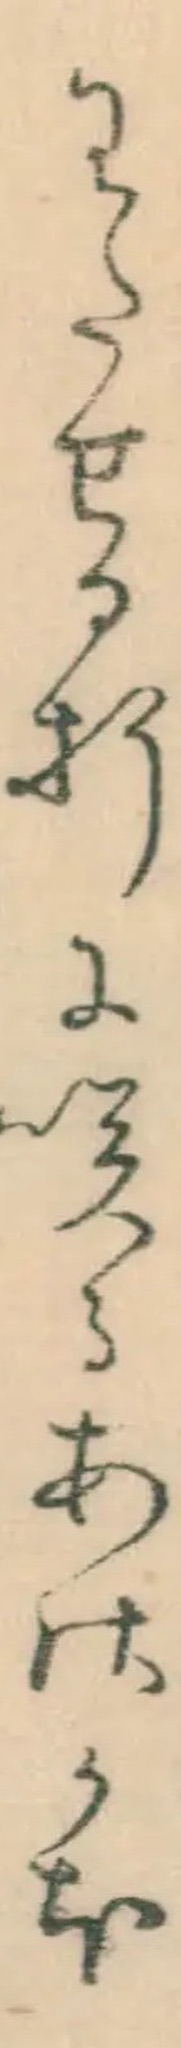わたせる折に咲るあさかほ仝
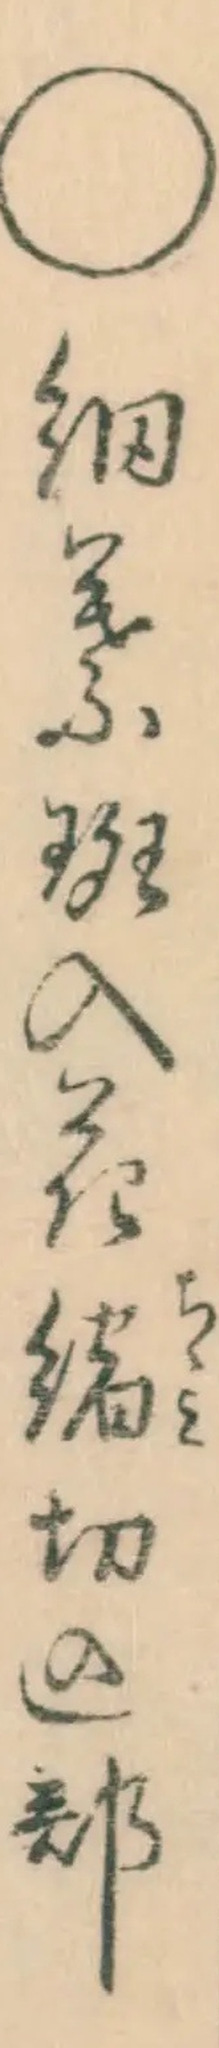○細葉斑入花縮切込部
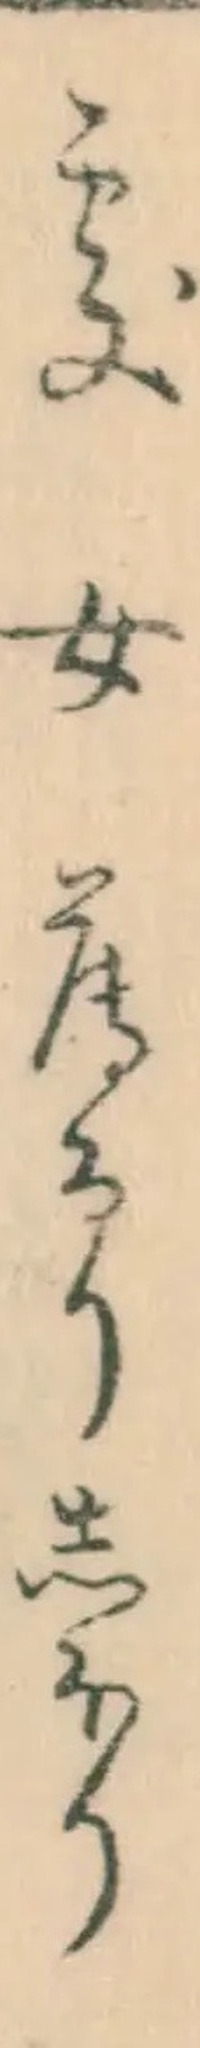処女薄るりしほり
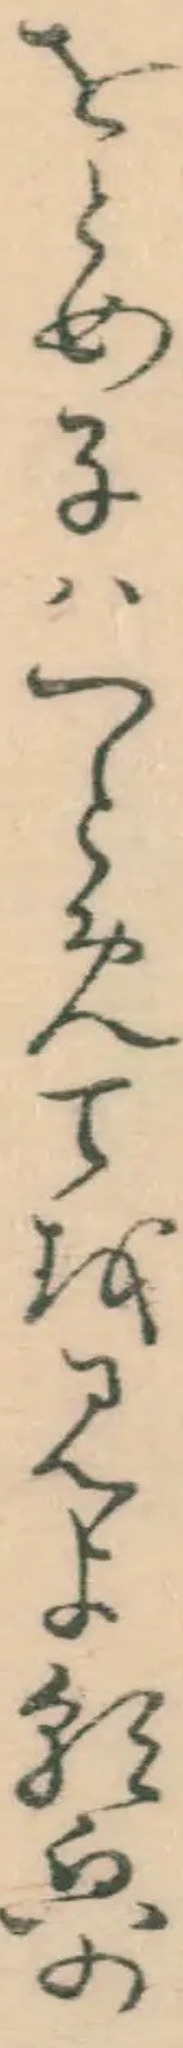をとめ子はつとめてをみよ朝皃の
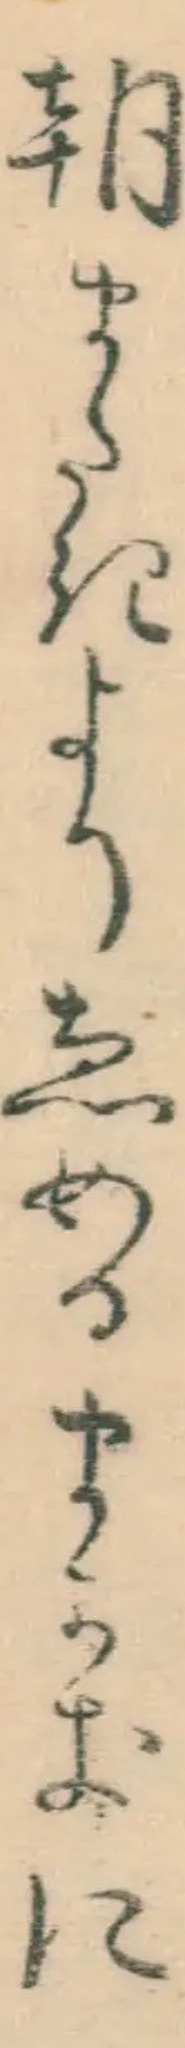朝またきよりゑめるまかきに貞顕

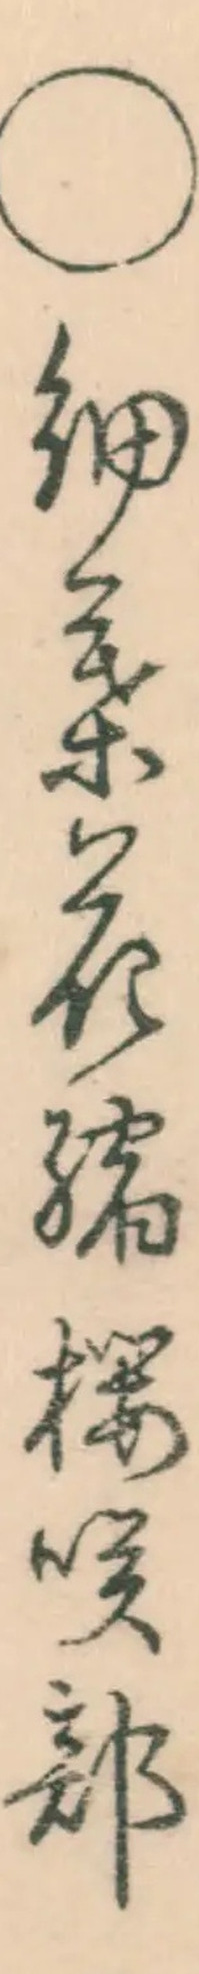○細葉花縮桜咲部
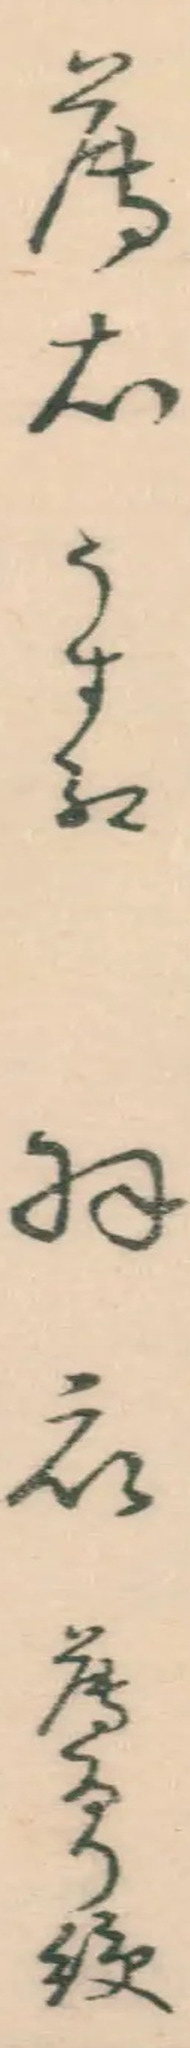薄衣うす紅羽衣薄るり絞
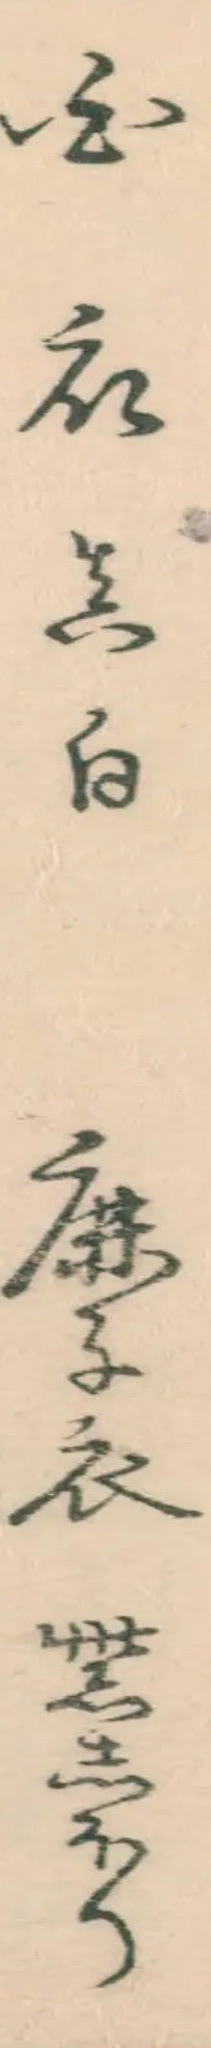花衣真白鹿子衣紫しほり
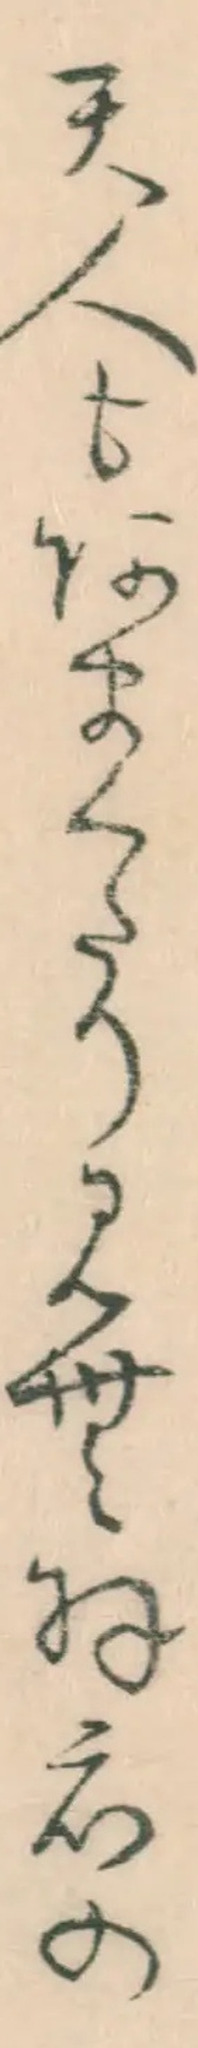天人もあまくたり見む羽衣の
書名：花壇朝顔通 2巻. [1]
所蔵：国立国会図書館 National Diet Library, JAPAN
